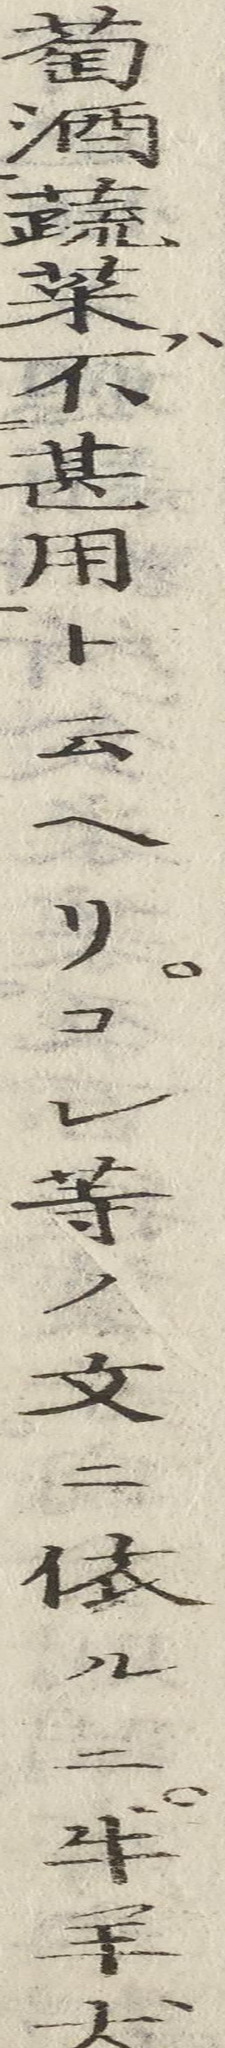萄酒蔬菜不ニ甚用ト云ヘリ。コレ等ノ文ニ依ルニ。牛羊犬
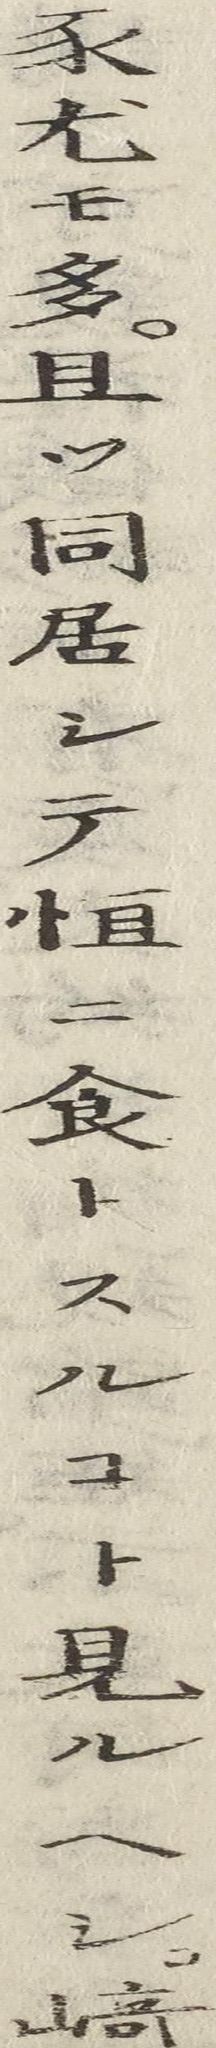豕尤モ多。且ツ同居シテ恒ニ食トスルコト見ルヘシ。崎
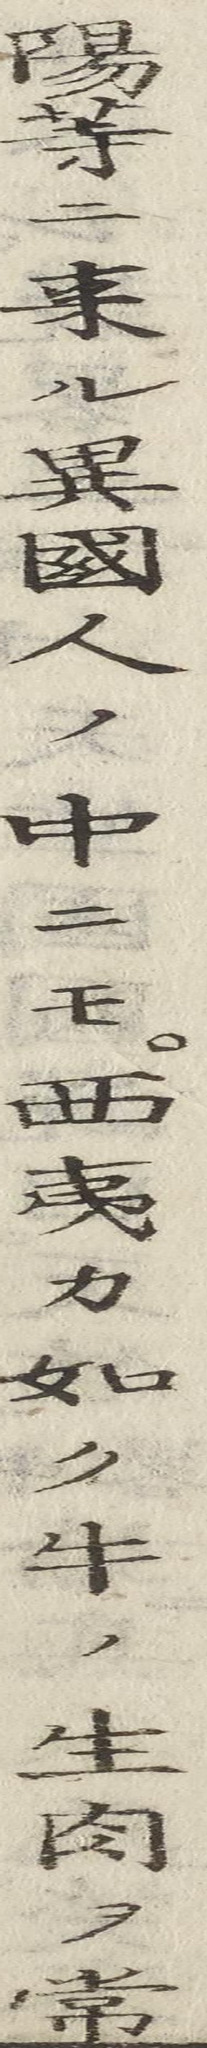陽等ニ来ル異国人ノ中ニモ。西夷カ如ク牛ノ生肉ヲ常
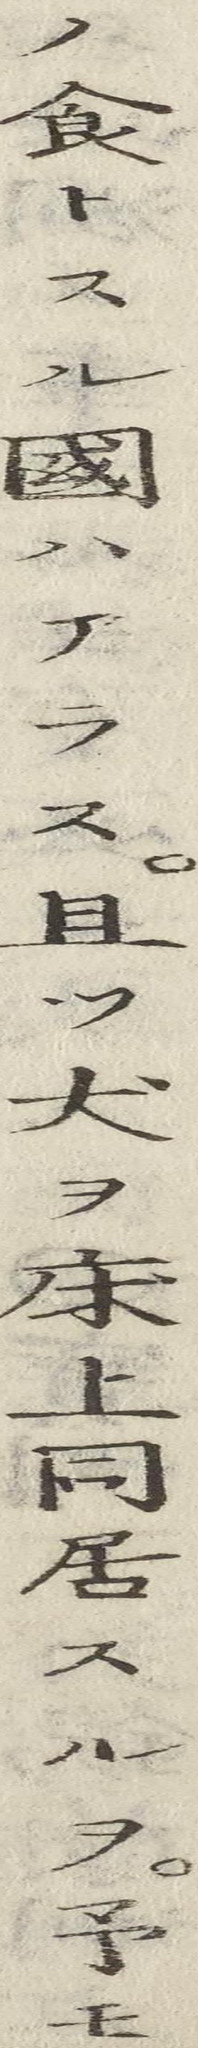ソ食トスル国ハアラス。且ツ犬ヲ床上同居スルヲ。予モ
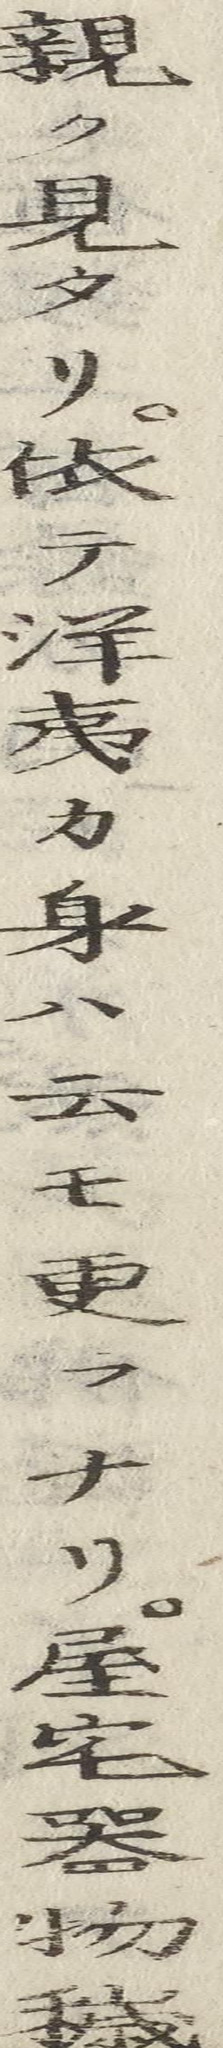親ク見タリ。依テ洋夷カ身ハ云モ更ラナリ。屋宅器物穢
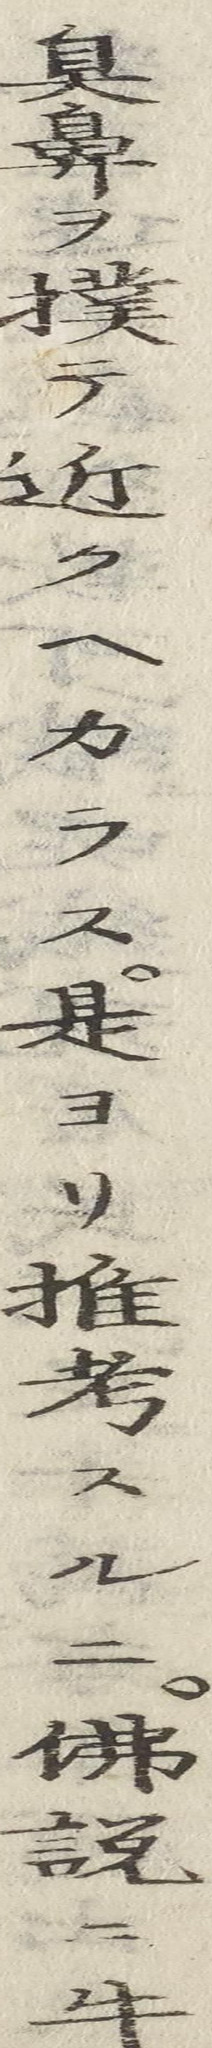臭鼻ヲ撲テ近クヘカラス。是ヨリ推考スルニ。仏説ニ牛
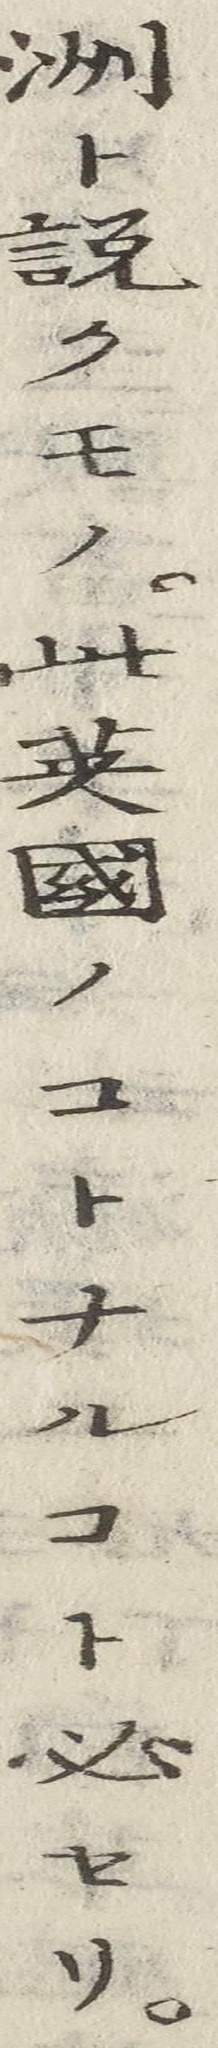洲ト説クモノ。此英国ノコトナルコト必セリ。

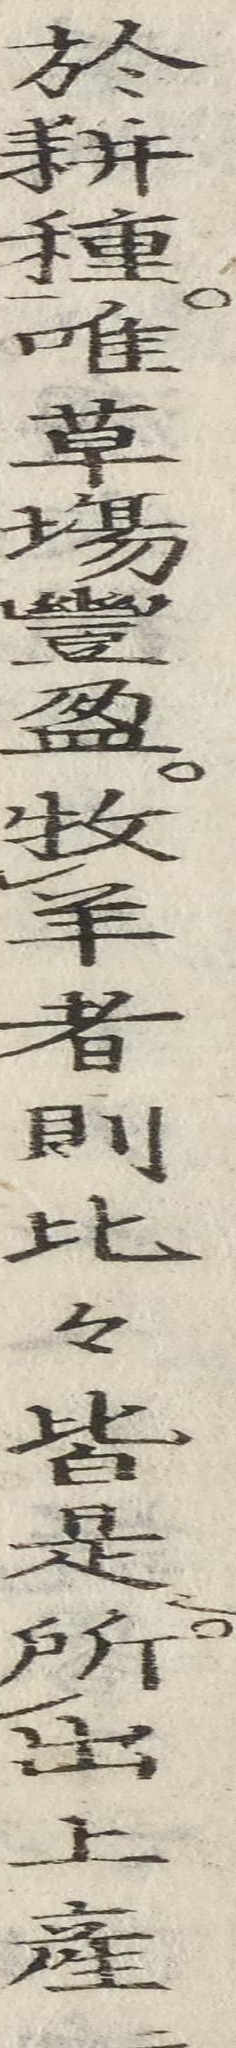於耕種。唯草場豐盈。牧羊者則比々皆是也。所出上産云云羊
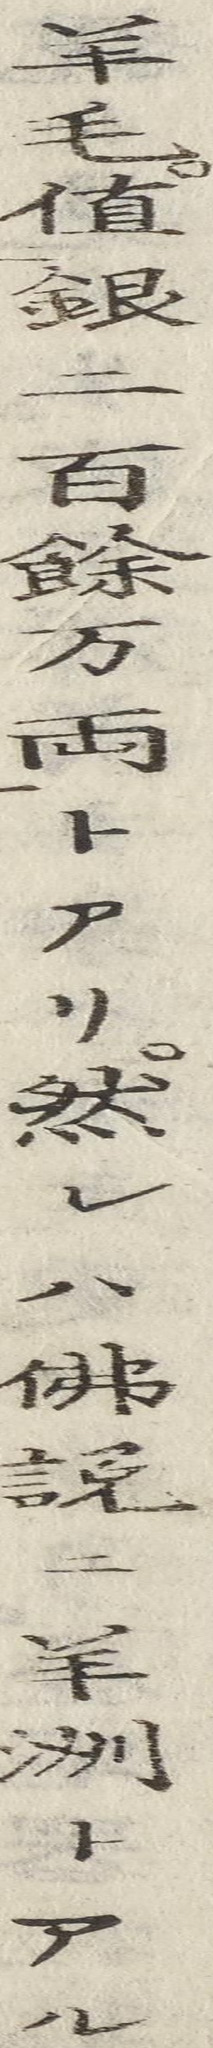羊毛。値ニ銀二百余万両トアリ。然レハ仏説ニ羊洲トアル
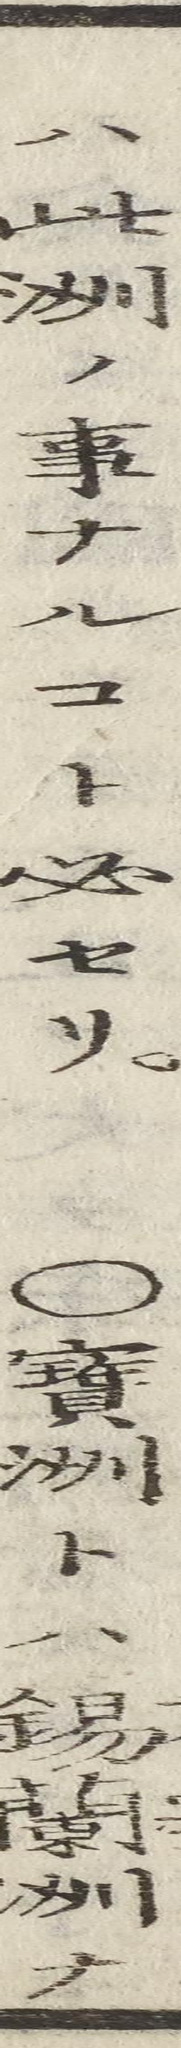ハ此洲ノ事ナルコト必セリ。〇宝洲トハ錫蘭洲ナ
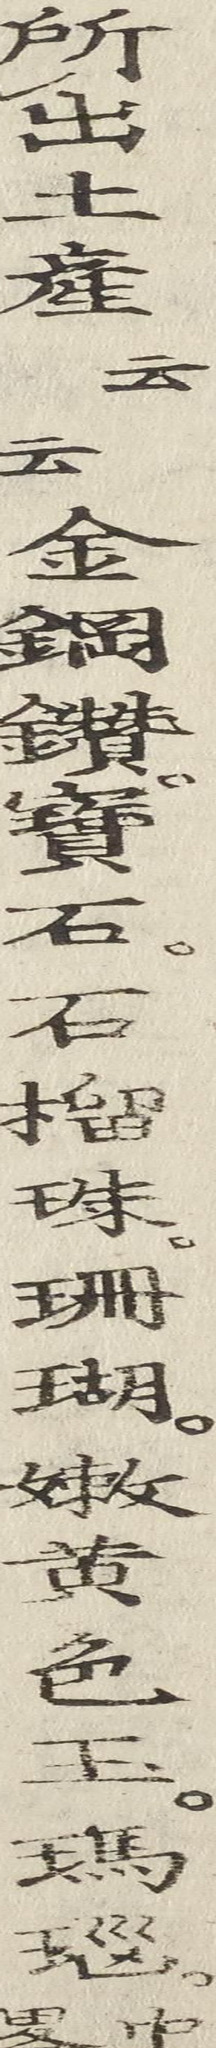所出土産云云金鋼鑽。宝石。石榴珠。珊瑚。嫩黄色玉。瑪瑙。中略
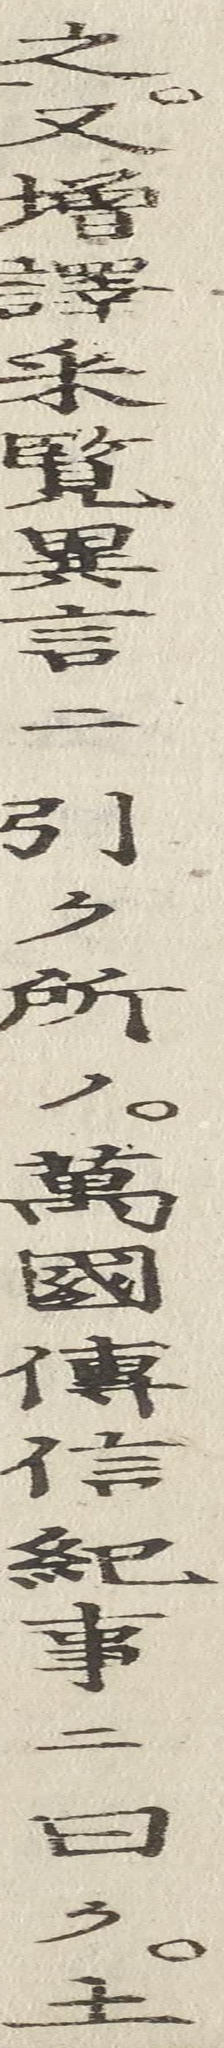之。又増譯釆覧異言ニ引ク所ノ。万国伝信紀事ニ曰ク。土
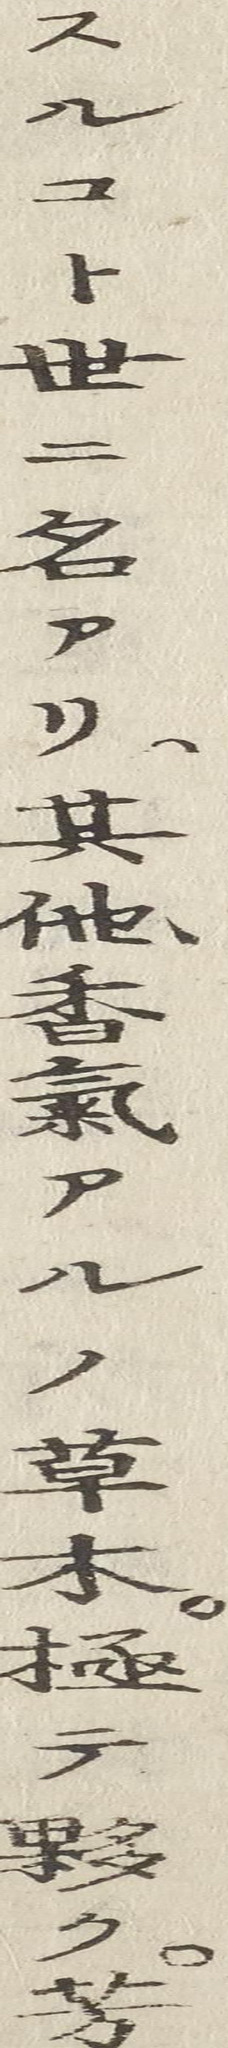スルコト世ニ名アリ。其他香気アルノ草木。極テ夥ク。芳
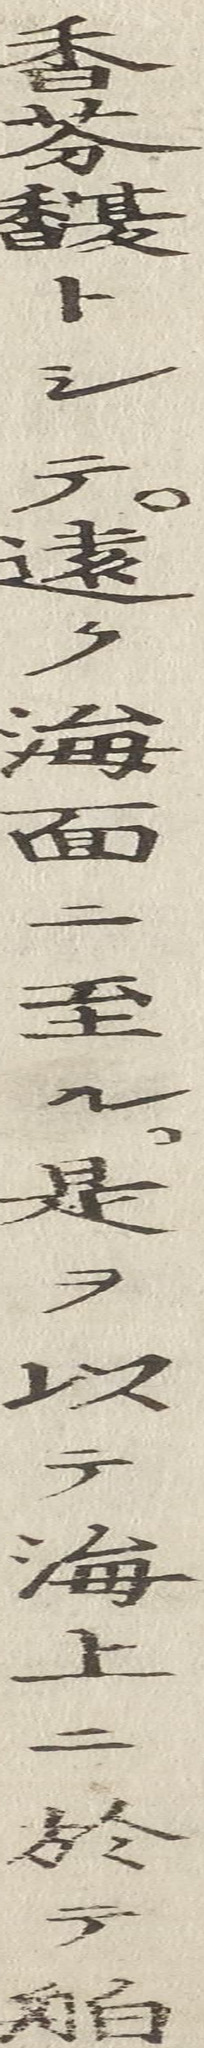香芬馥トシテ。遠ク海面ニ至ル。是ヲ以テ海上ニ於テ舶
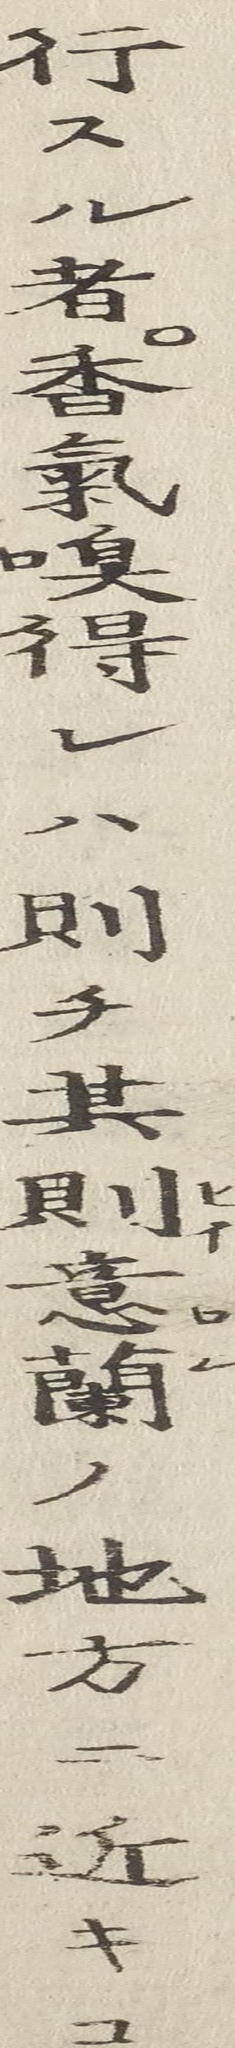行スル者。香気嗅得レハ則チ其則意蘭ノ地方ニ近キコ

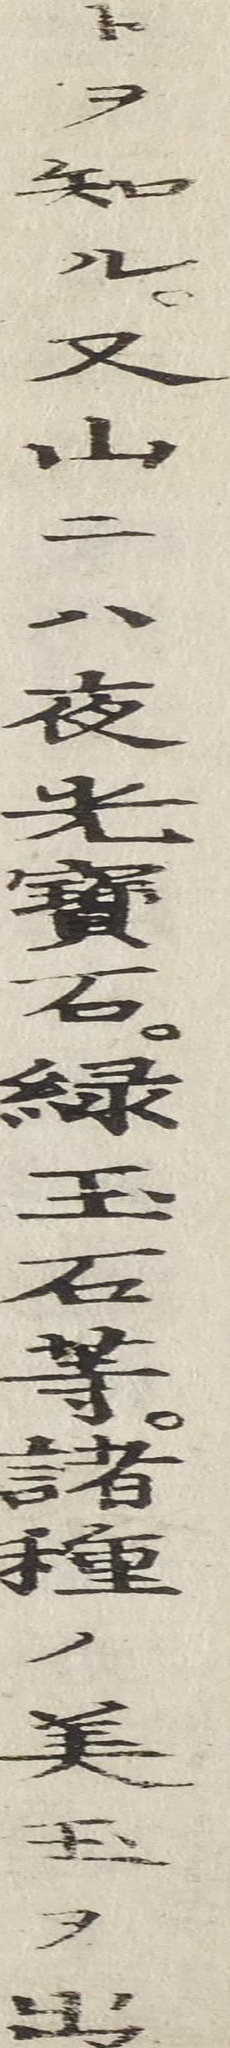トヲ知ル。又山ニハ夜光宝石。緑玉石等。諸種ノ美玉ヲ出
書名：護法新論　二編　中
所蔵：東京大学地震研究所図書室 Earthquake Research Institute Library, The University of Tokyo, JAPAN
